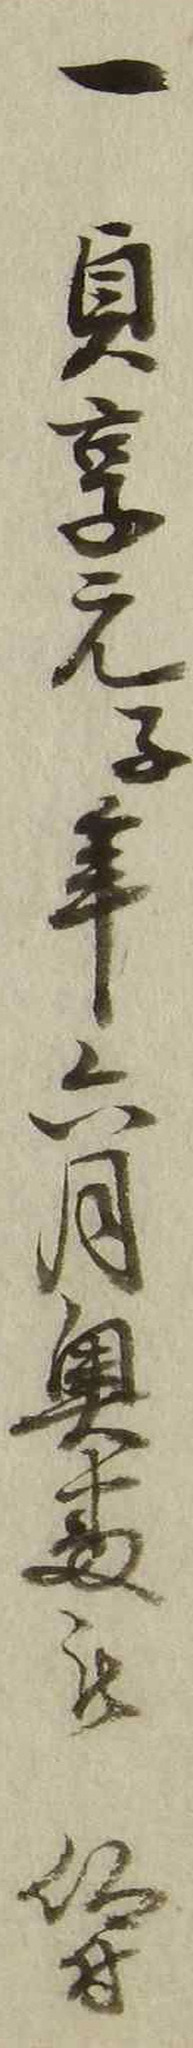一貞享元子六月奥番被仰付
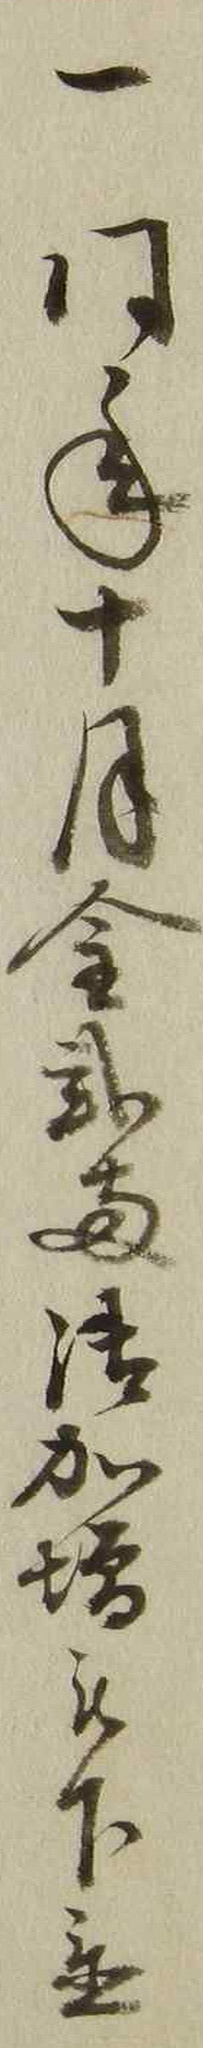一同年十月金弐両御加増被下置
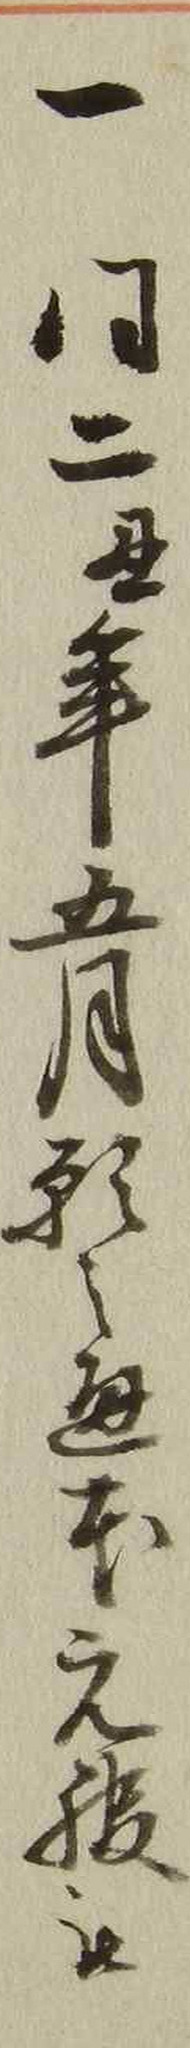一同二丑年五月願之通本元服被
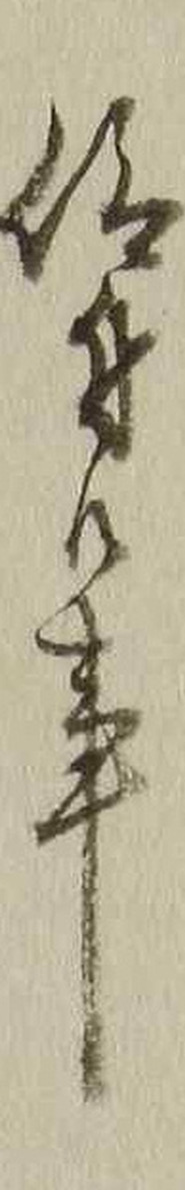仰付候事
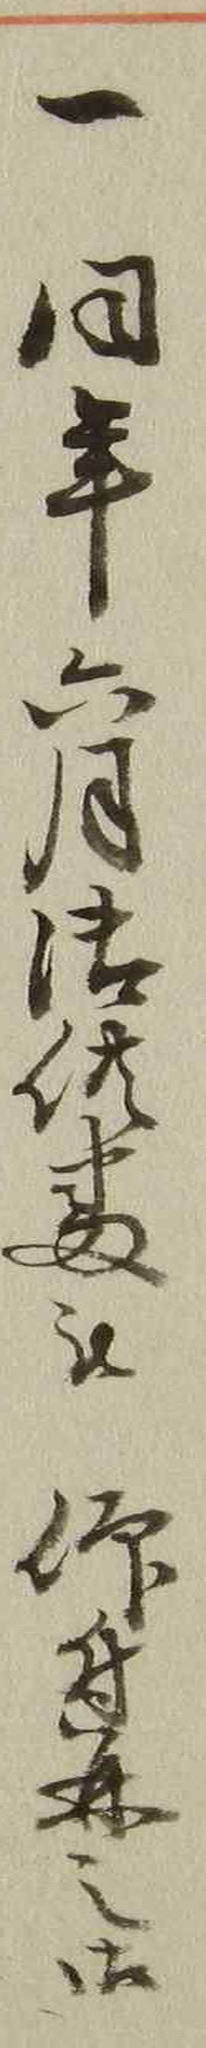一同年六月御供番被仰付再之御
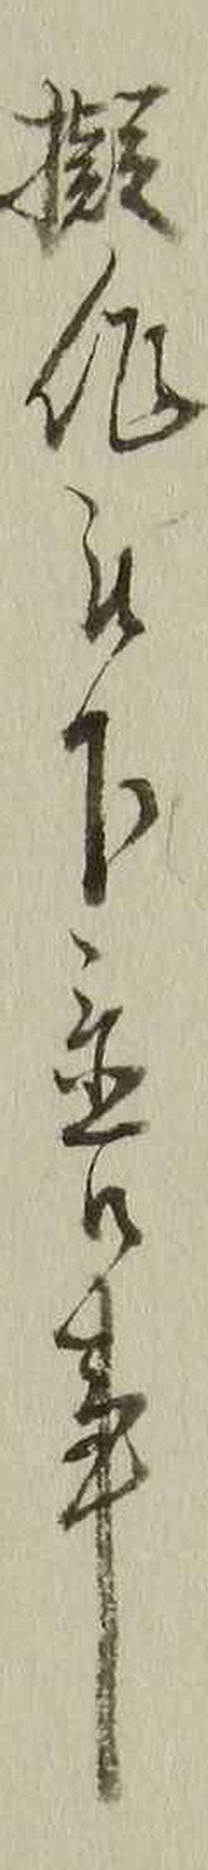擬作被下置候事
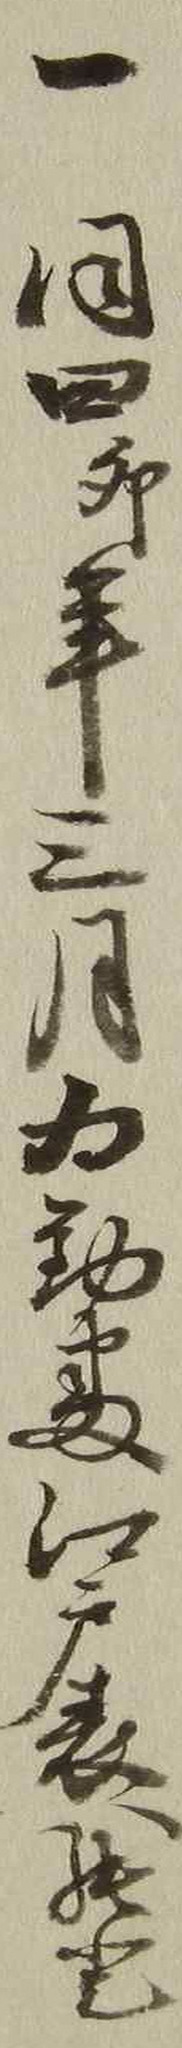一同四卯年三月為勤番江戸表へ罷登
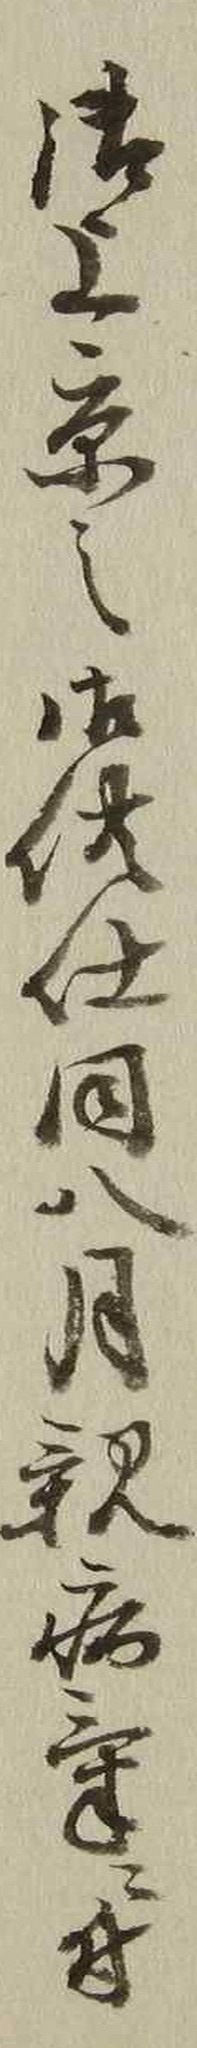御上京之御供仕同八月親病気ニ付
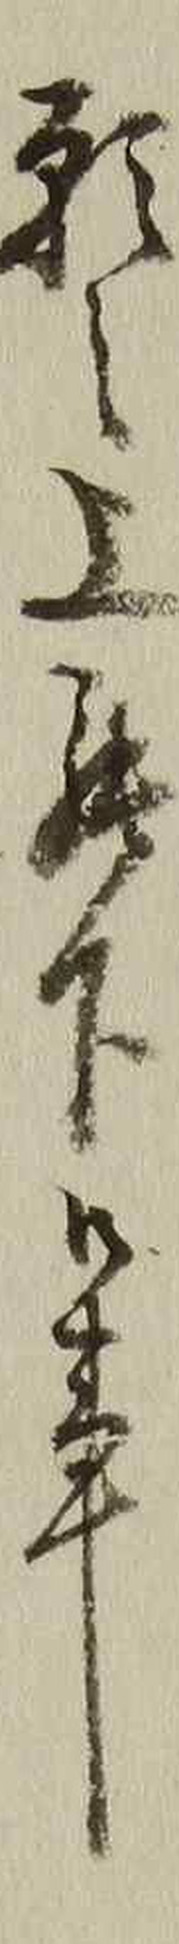願之上罷下候事
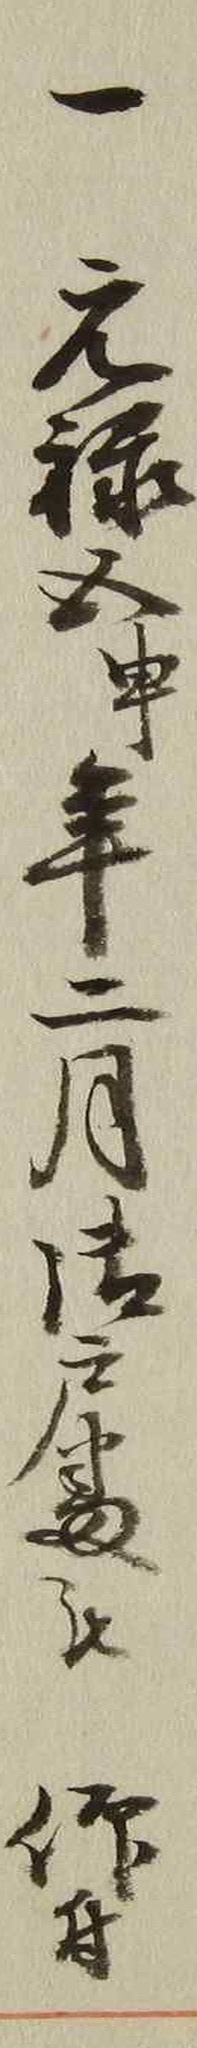一元禄五申年二月御戸番被仰付
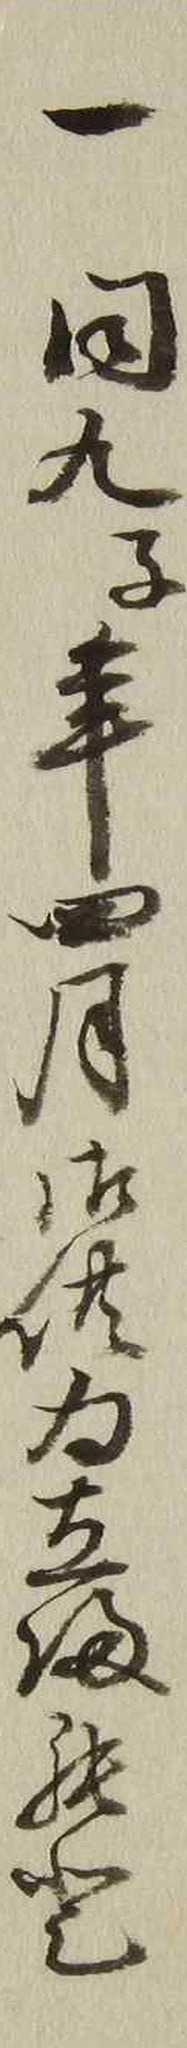一同九子年四月御供為立帰罷登
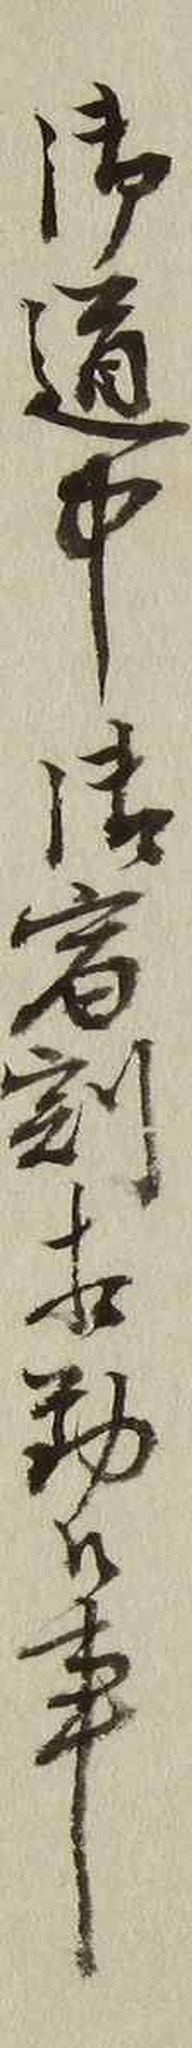御道中御宿割相勤候事
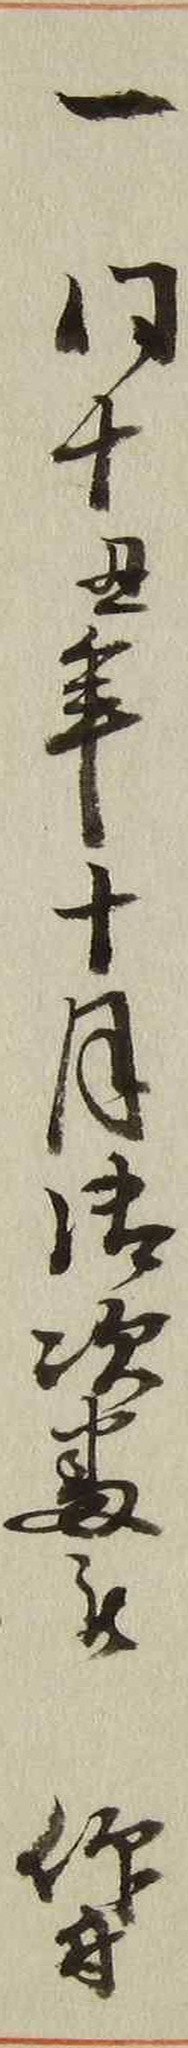一同十丑年十月御次番被仰付
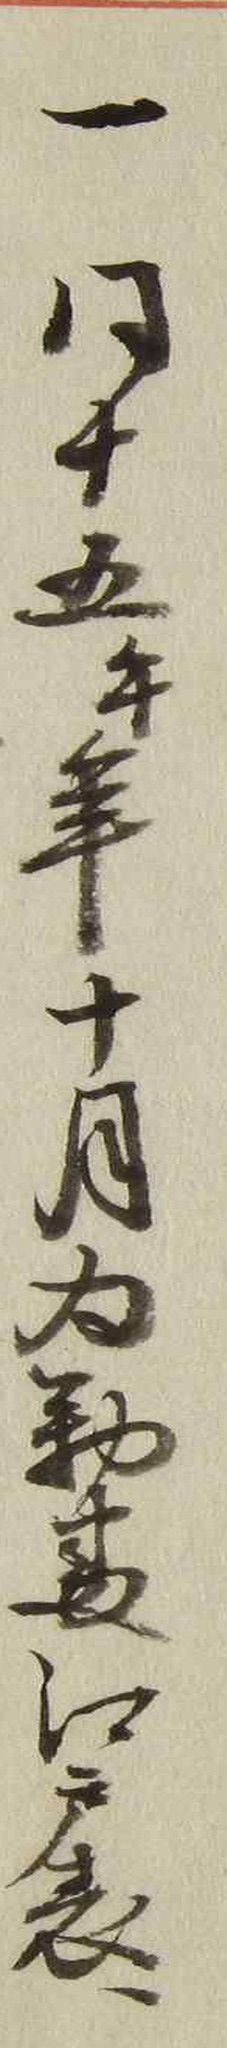一同十五午年十月為勤番江戸表へ
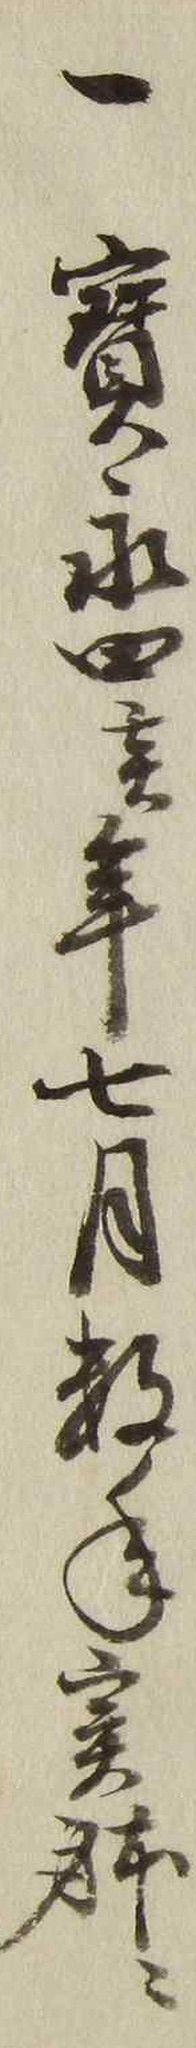一宝永四亥年七月数年実体ニ

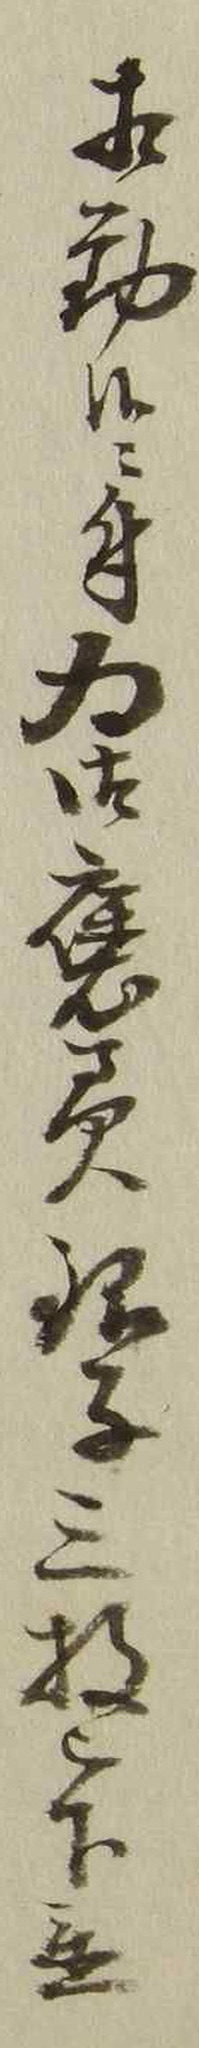相勤候ニ付為御褒美銀子三枚被下置
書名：諸士系譜　巻之31　い之部31
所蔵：会津若松市立会津図書館
